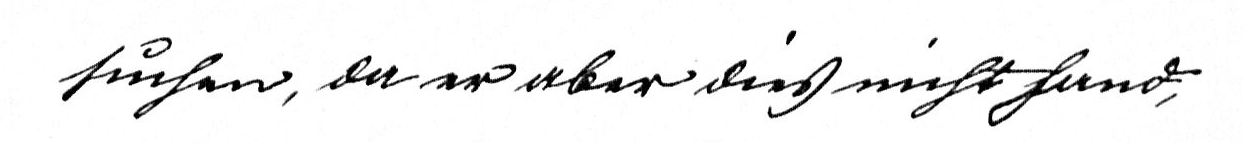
suchen, da er aber dies nicht hand,
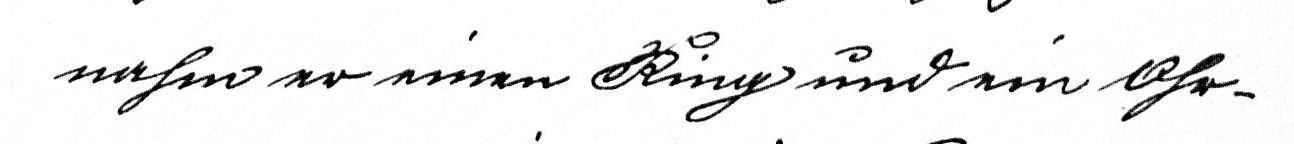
nahm er einen King und ein Ohr¬
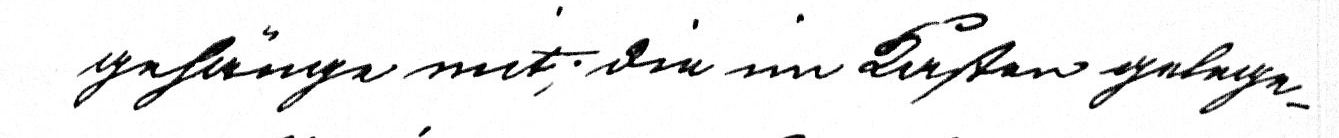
gehänge mit, die im Kasten gelege¬
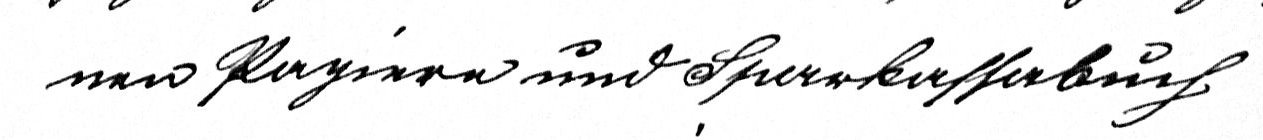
nen Papiere und Sparkassabuch
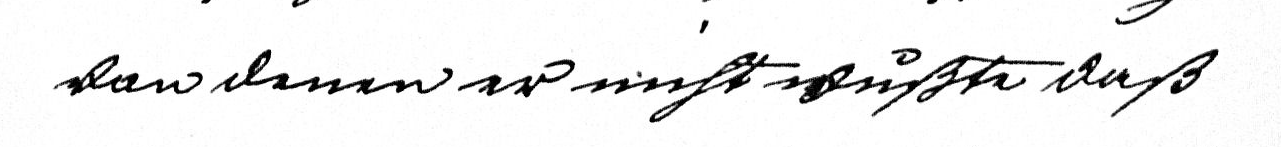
von denen er nicht wußte daß
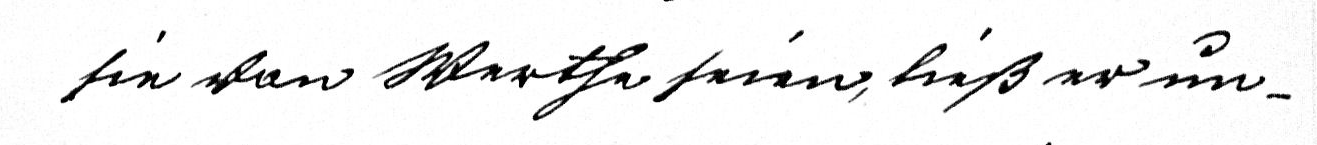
sie von Werthe seien, ließ er un¬
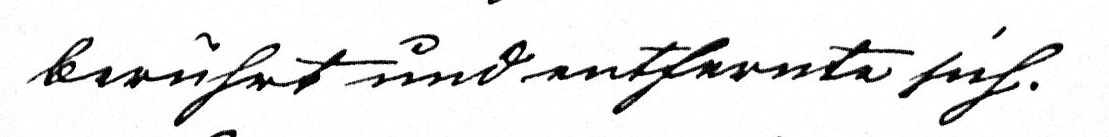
berührt und entfernte sich.
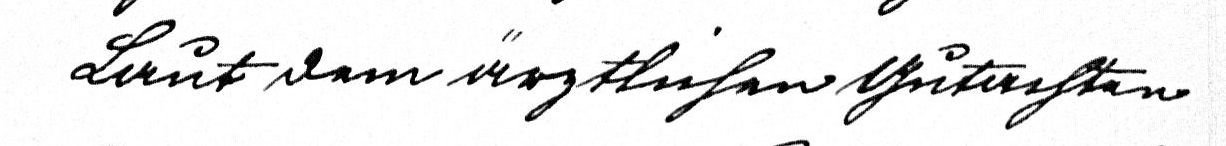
Laut dem ärztlichen Gutachten
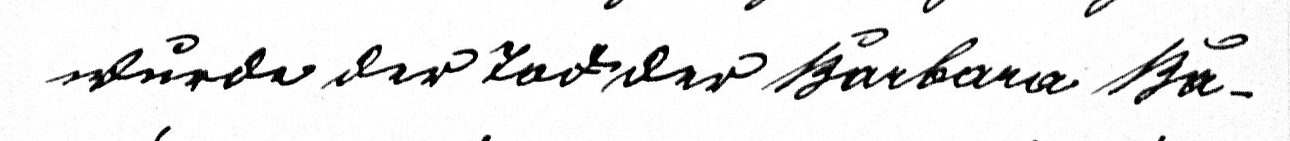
wurde der Tod der Barbara Ba¬
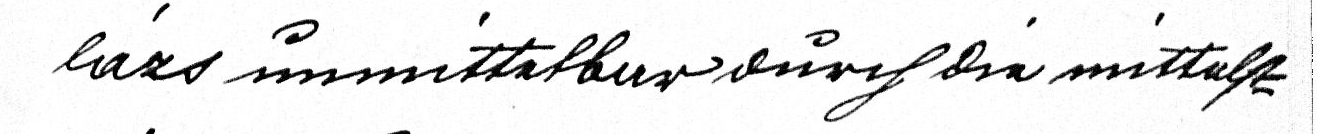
lázs unmittelbar durch die mittelst¬
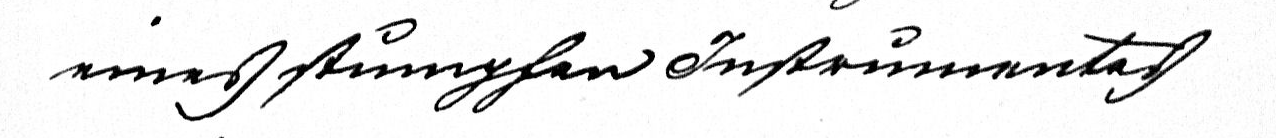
eines stumpfen Instrumentes
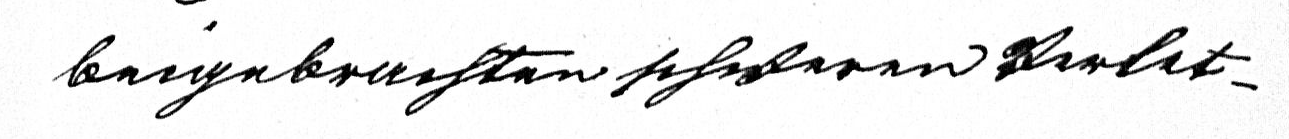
beigebrachten schweren Verlet¬
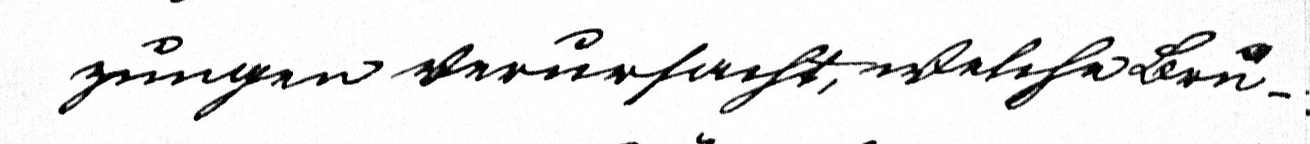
zungen verursacht, welche Bru
